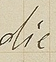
die er
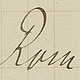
Rom
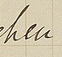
erhalten
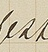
hat.
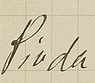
mich
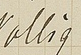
dieser
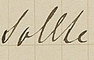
rathlos
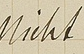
macht.
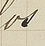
nicht
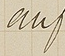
ich
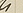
weiss,
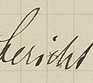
nicht
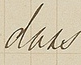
Diese
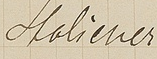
Italiener
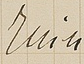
speculiren
